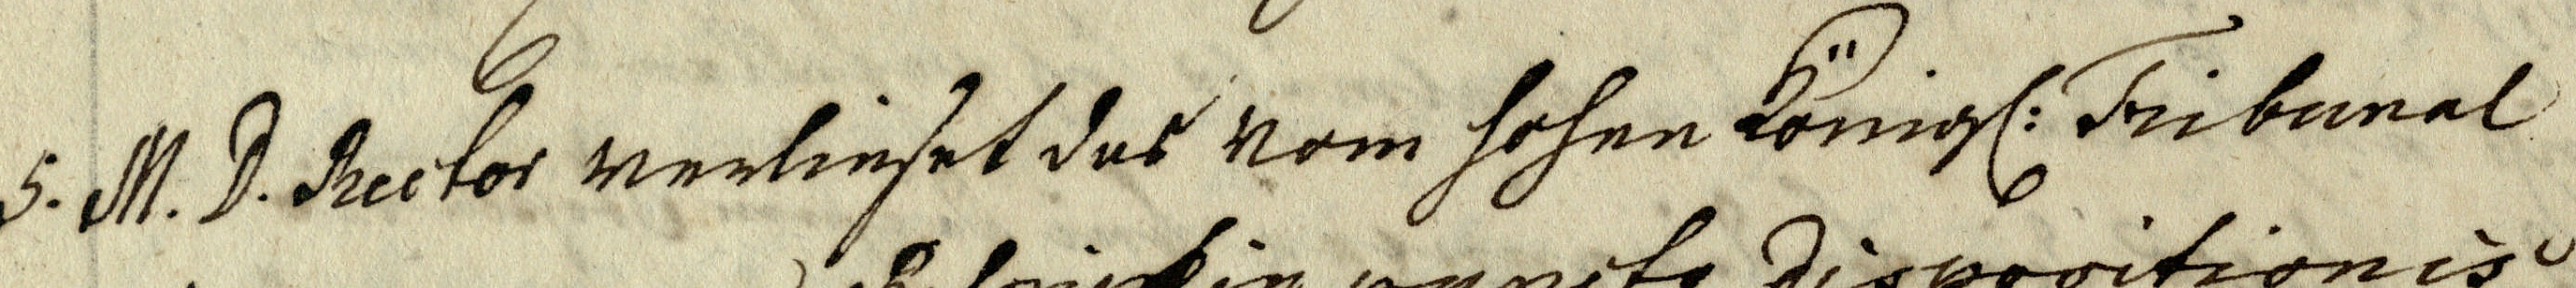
5. M. D. Rector verlieset das vom hohen Königl. Tribunal
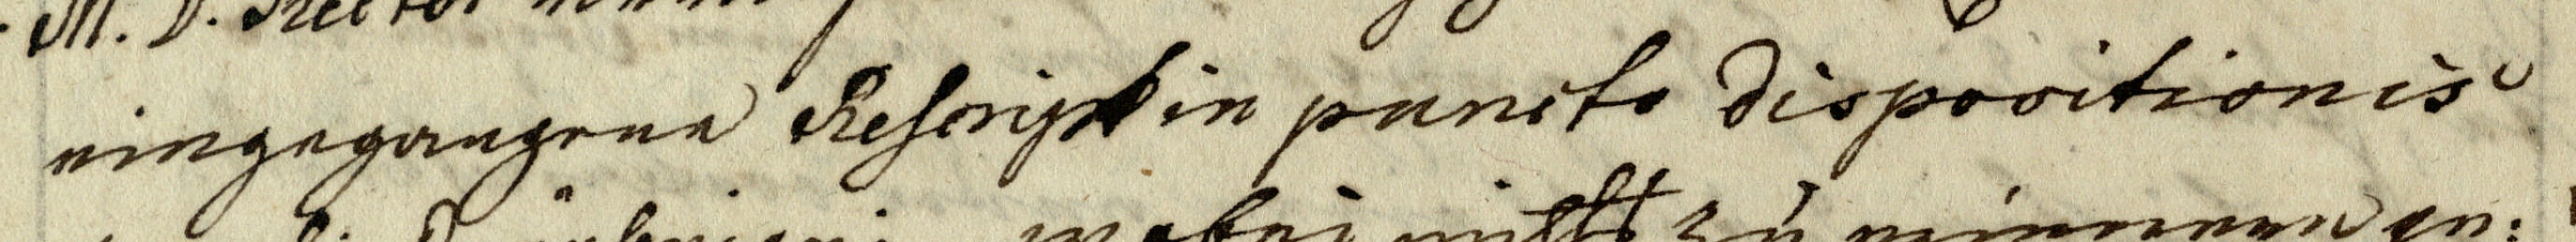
eingegangene Rescript in puncto dispositionis
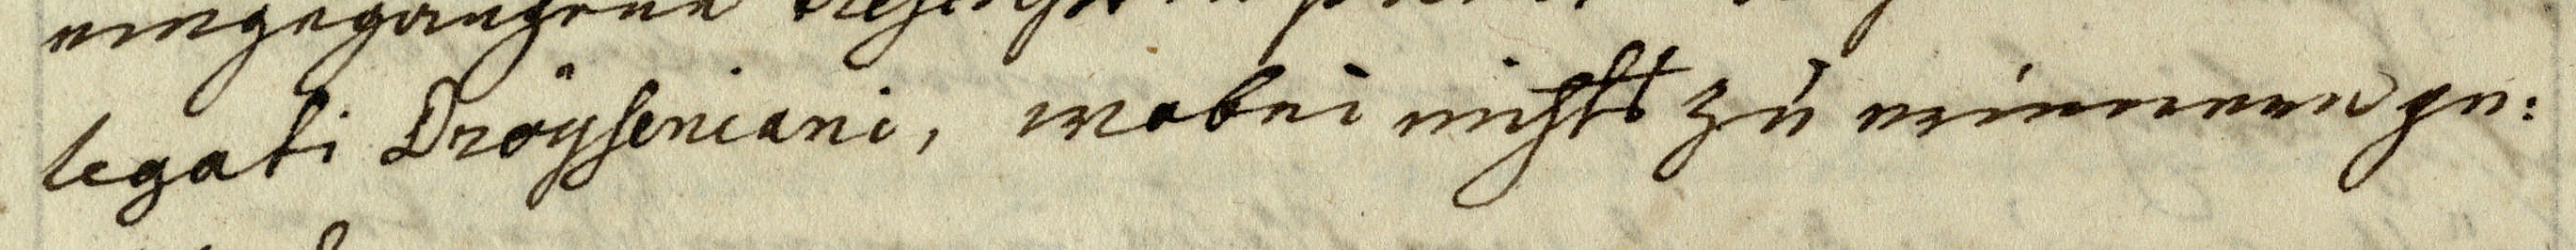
legati Droÿseniani, wobei nichts zu erinnern ge¬
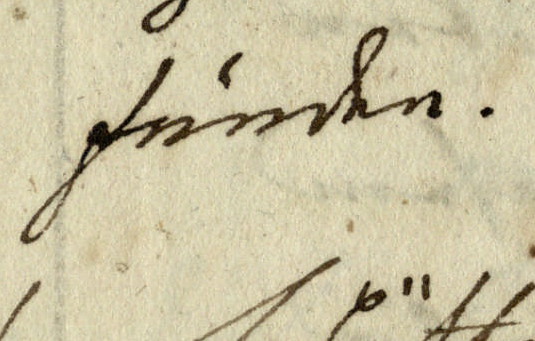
funden.
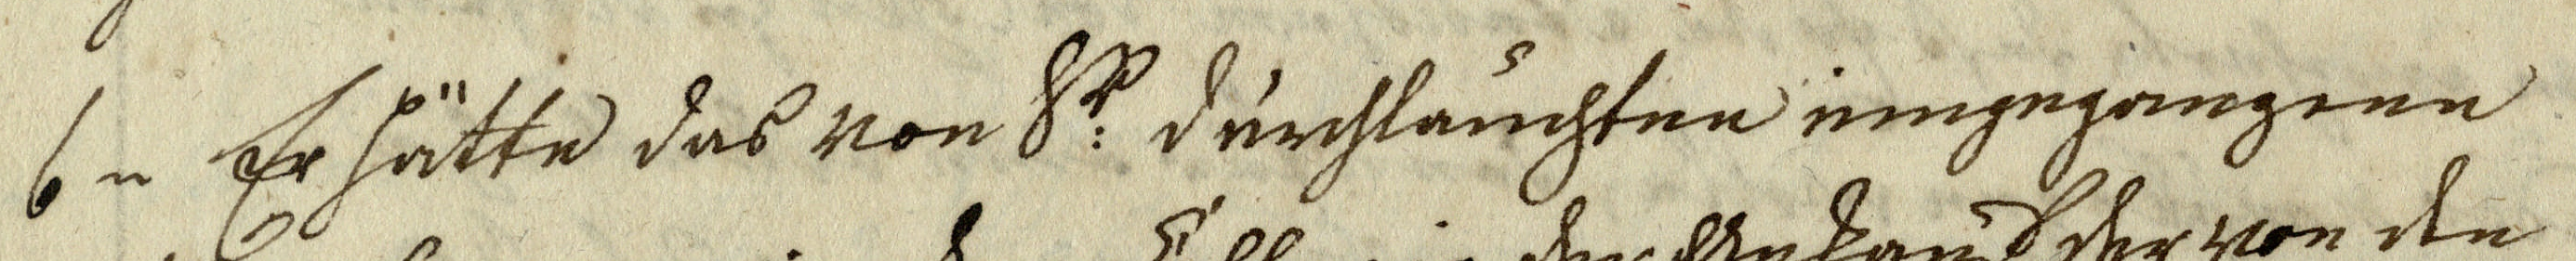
6. Er hätte das von Sr. Durchlauchten eingegangene
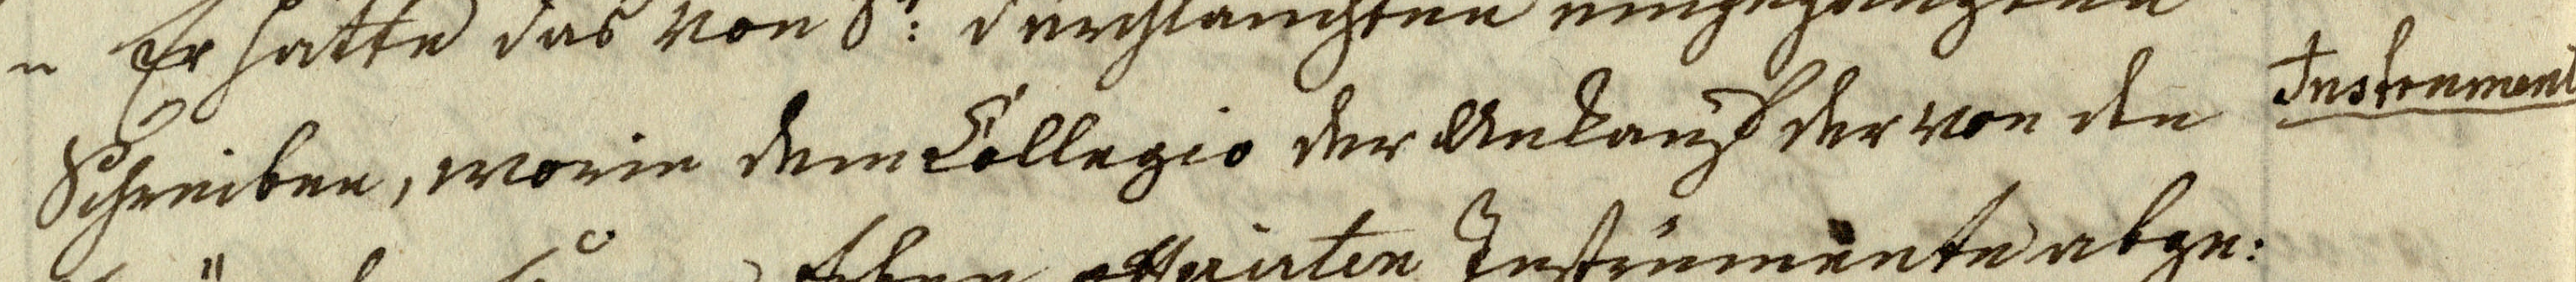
Schreiben, worin dem Collegio der Ankauf der von den Instrumente
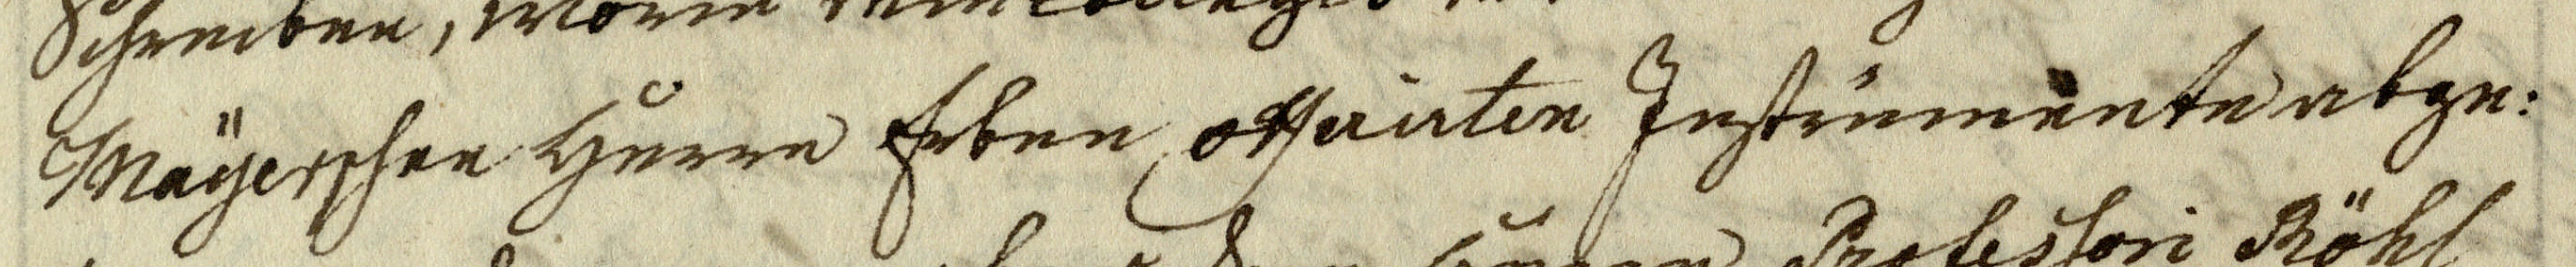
Maÿerschen Herrn Erben offerirten Instrumente abge¬
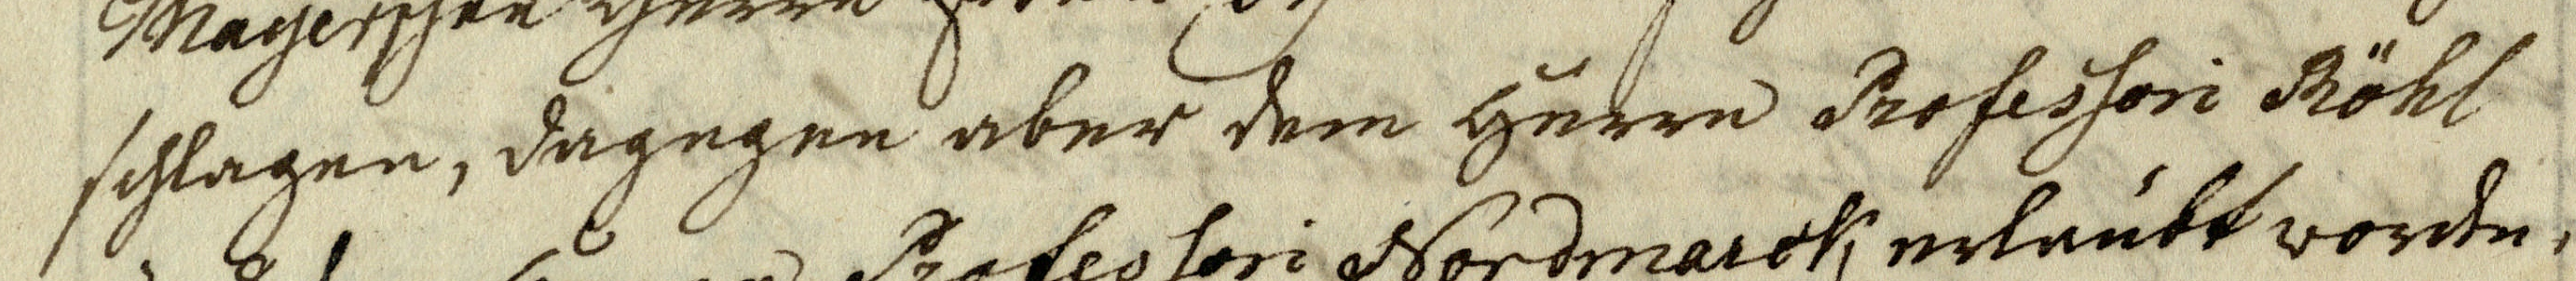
schlagen, dagegen aber dem Herrn Professori Röhl
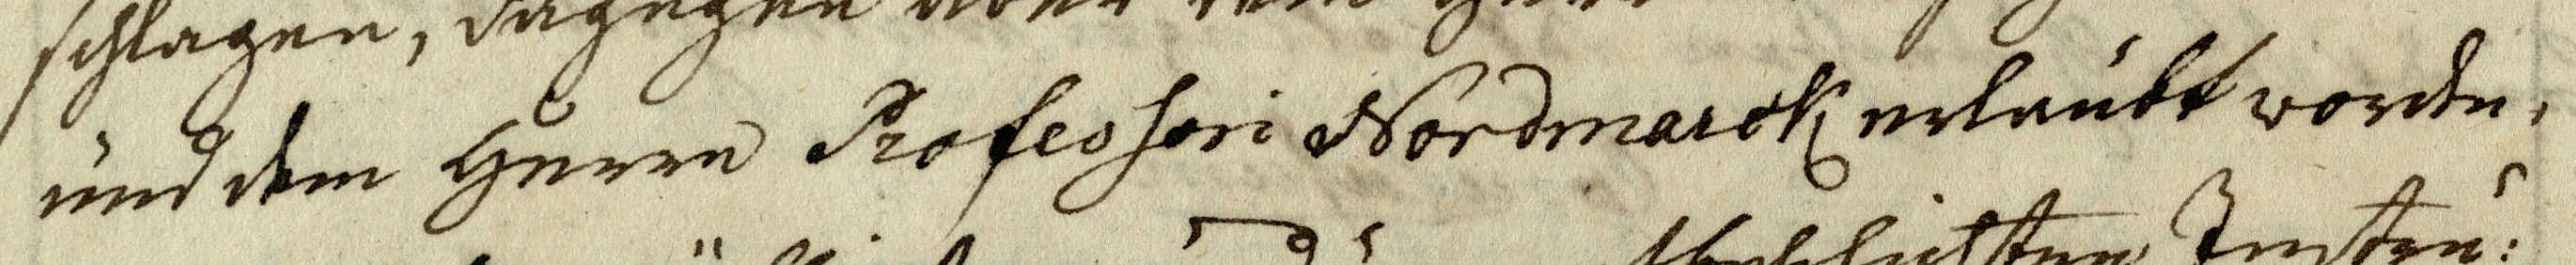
und dem Herrn Professori Nordmarck erlaubt worden,
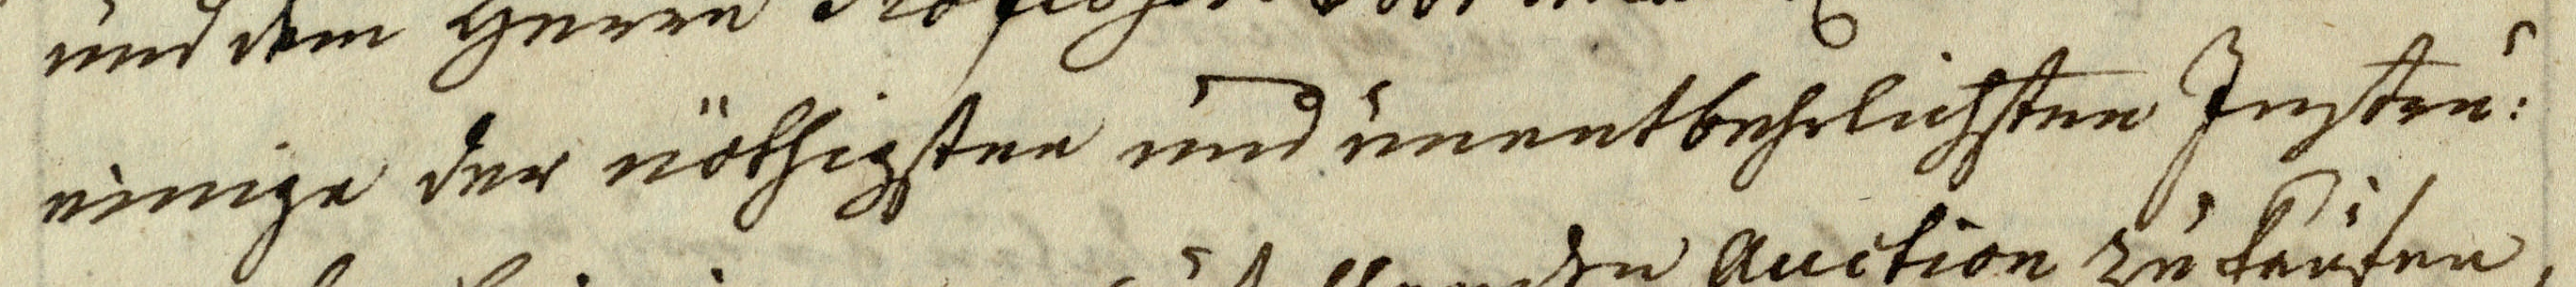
einige der nöthigsten und unentbehrlichsten Instru¬
